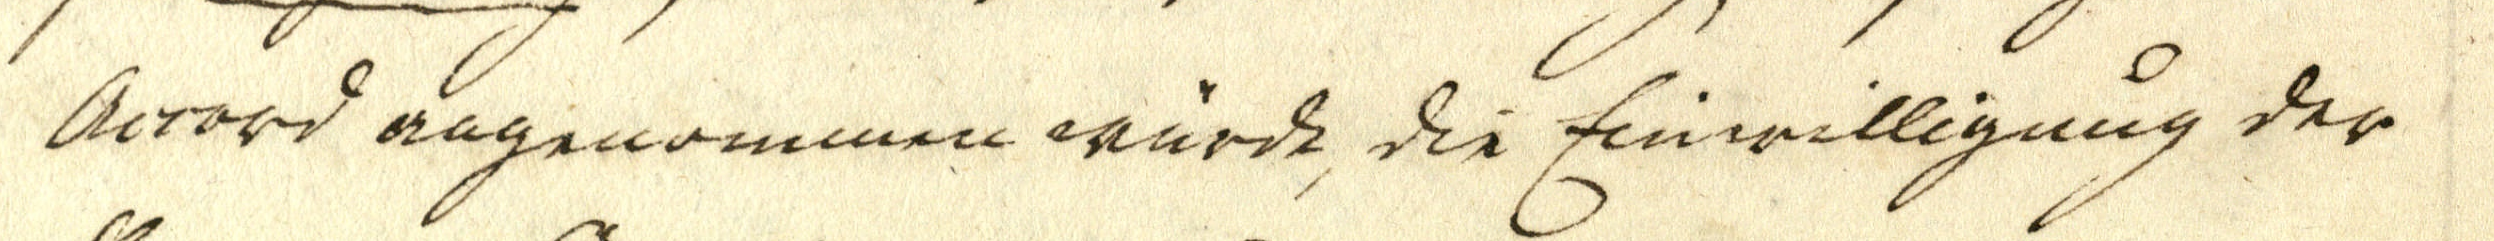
Accord angenommen würde, die Einwilligung der
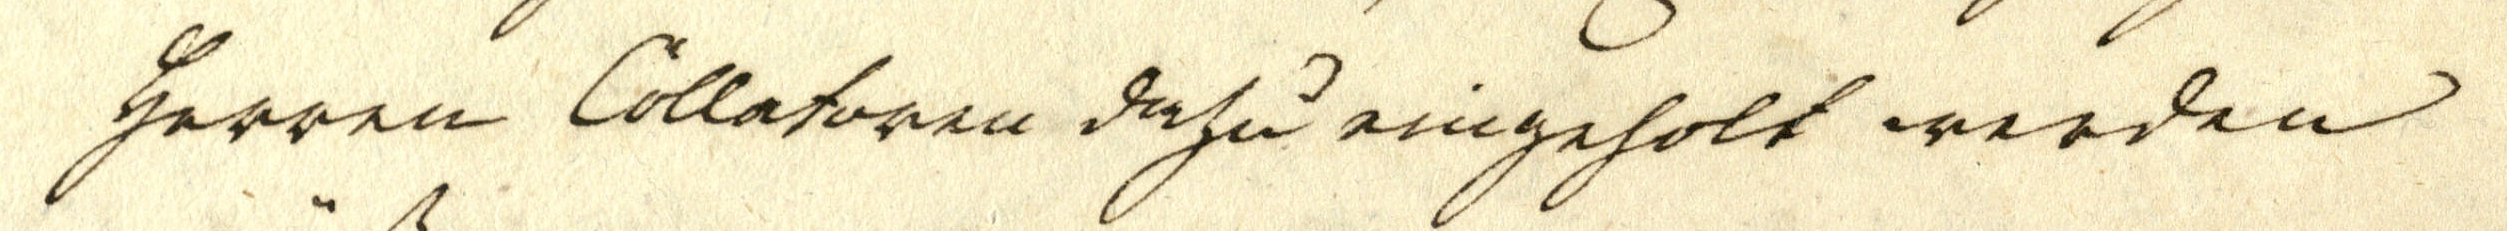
Herren Collatoren dazu eingeholt werden
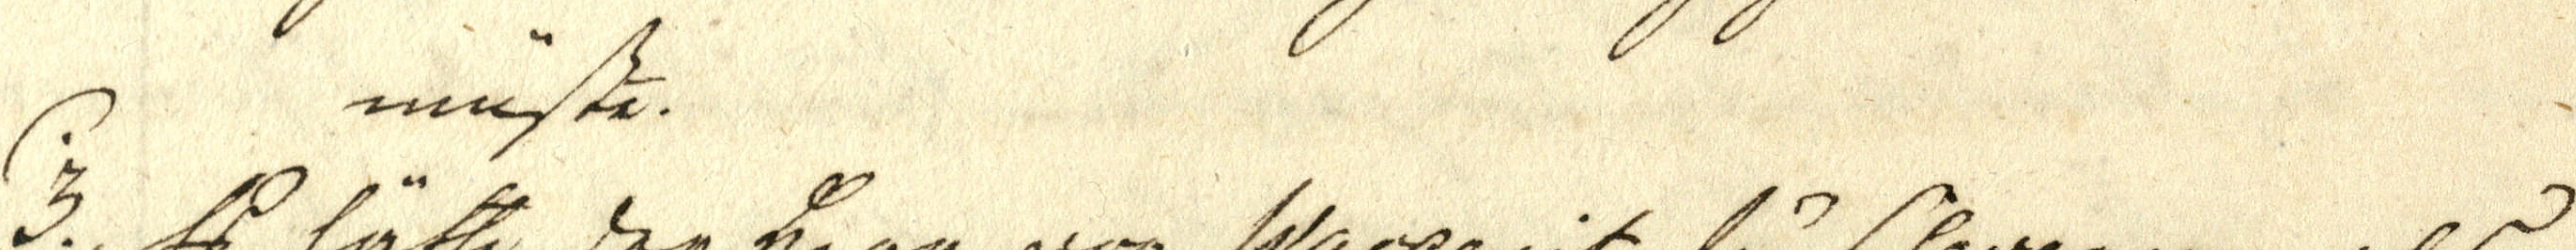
müste.
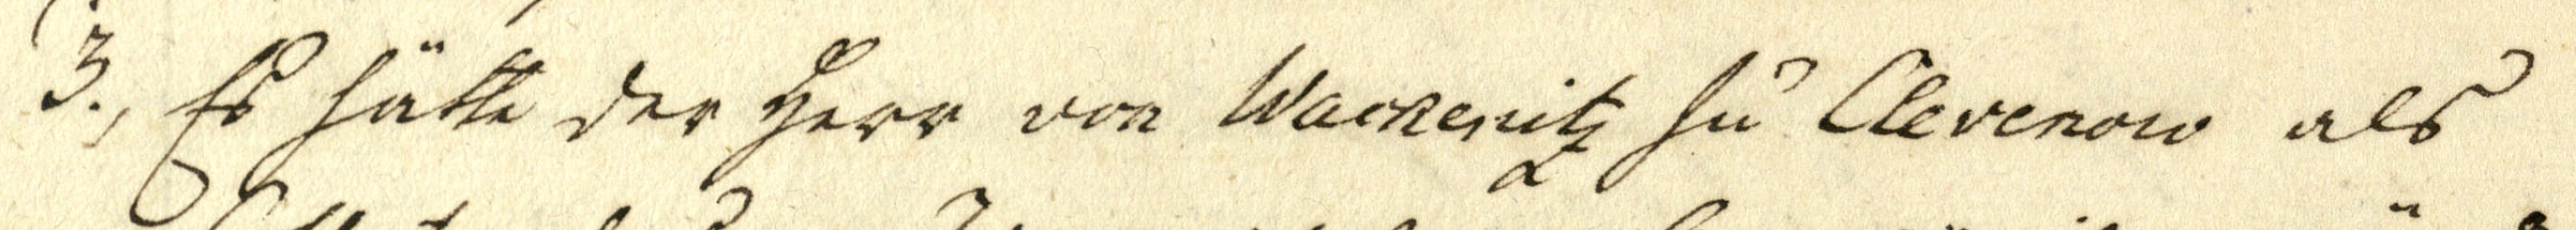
3., Es hätte der Herr von Wackenitz zu Clevenow als
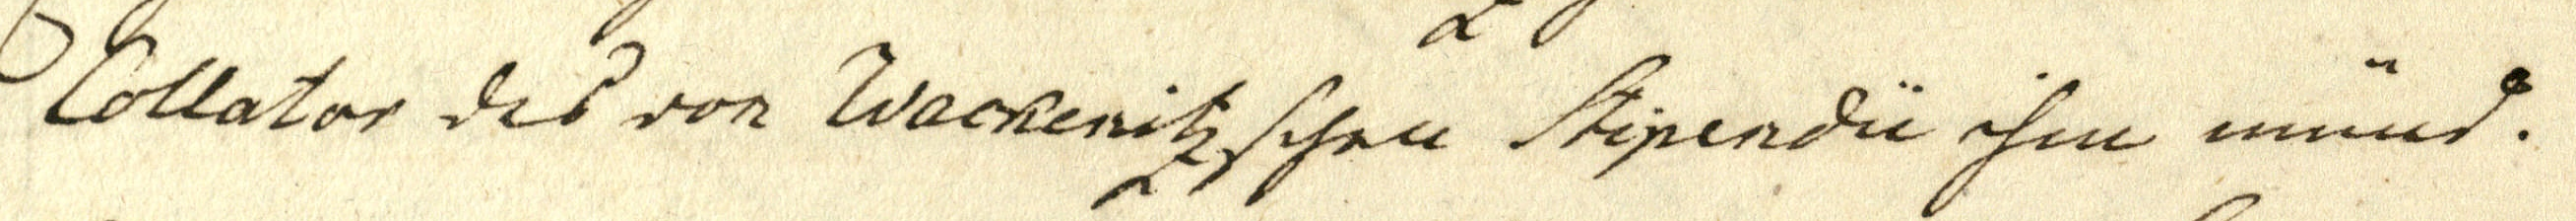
Collator des von Wackenitzschen Stipendii ihm münd¬
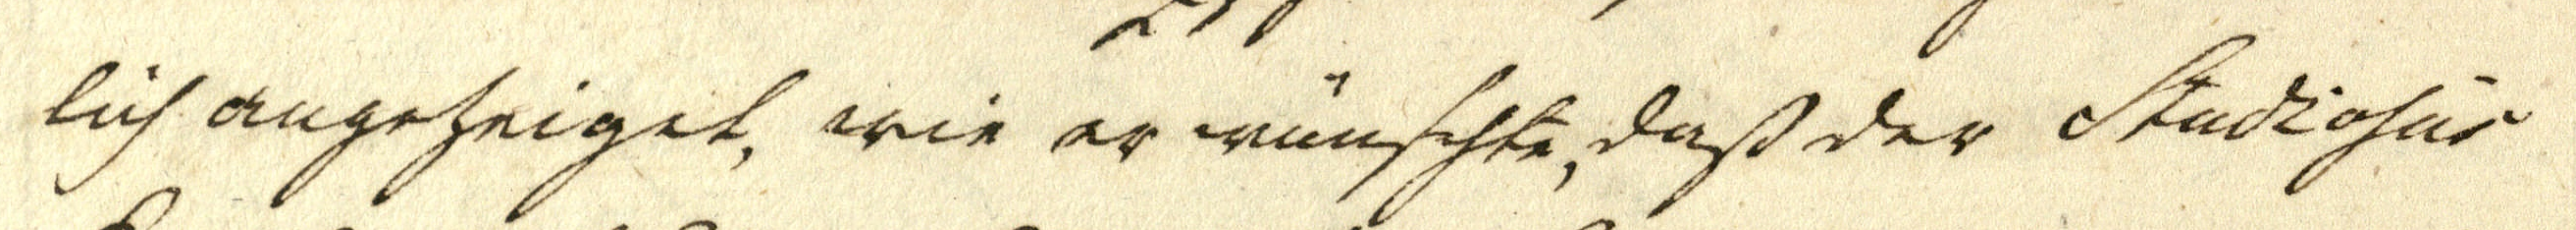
lich angezeiget, wie er wünschte, daß der Studiosus
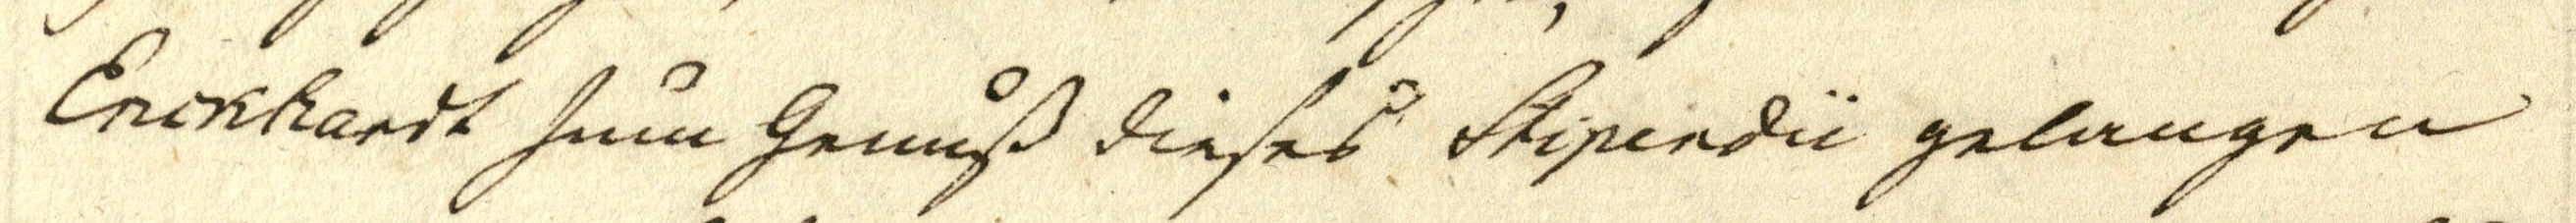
Enckhardt zum Genuß dieses Stipendii gelangen
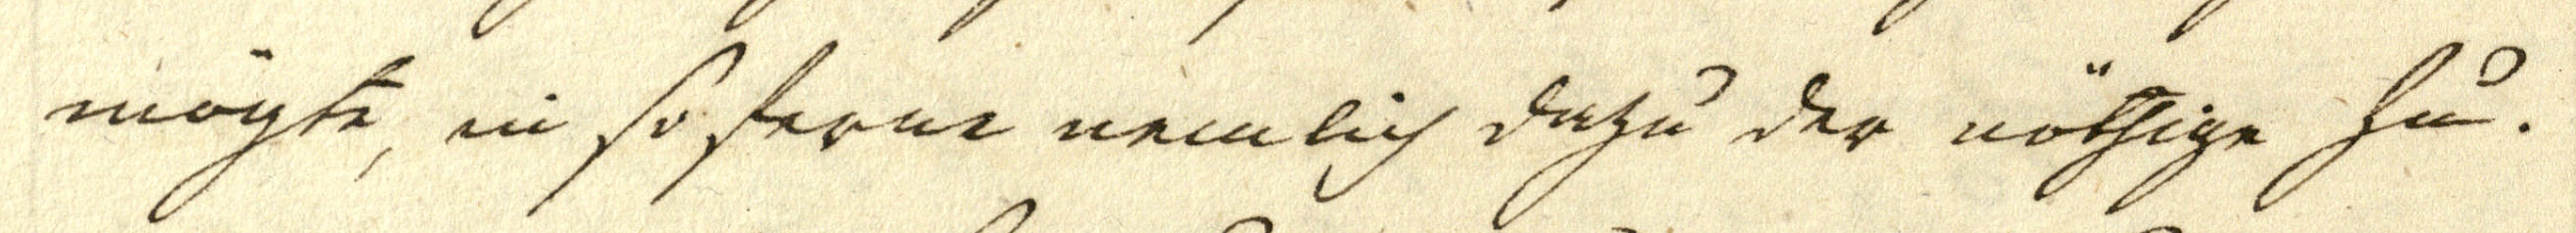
mögte, in so ferne nemlich dazu der nöthige Zu¬
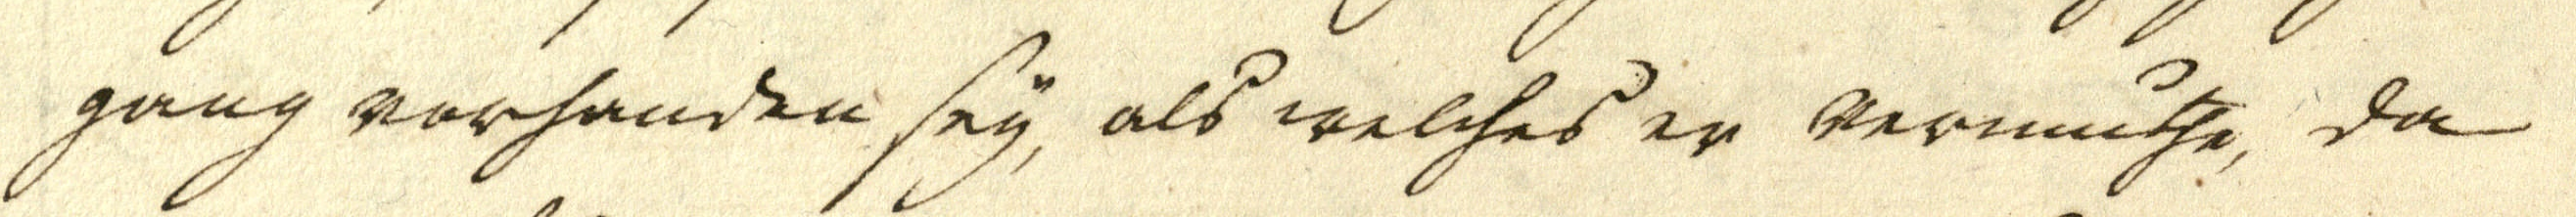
gang vorhanden seÿ, als welches er vermuthe, da
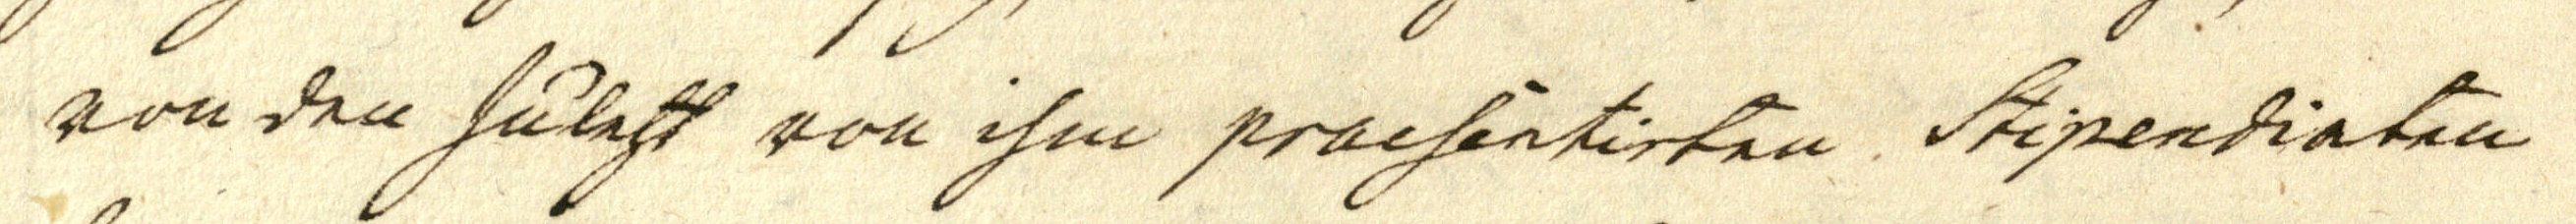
von den zuletzt von ihm praesentirten Stipendiaten
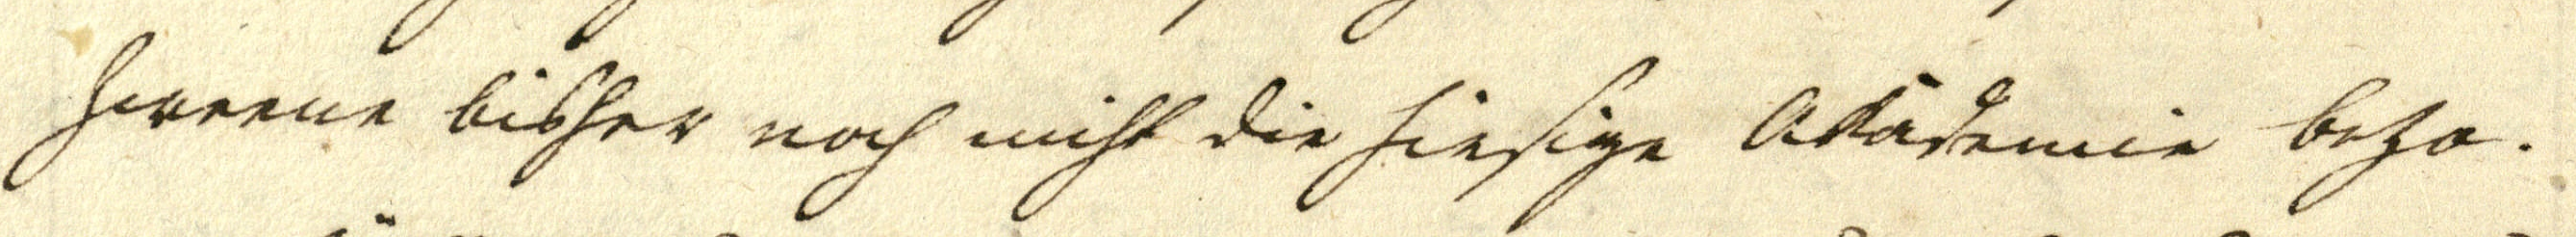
zweene bisher noch nicht die hiesige Akademie bezo¬
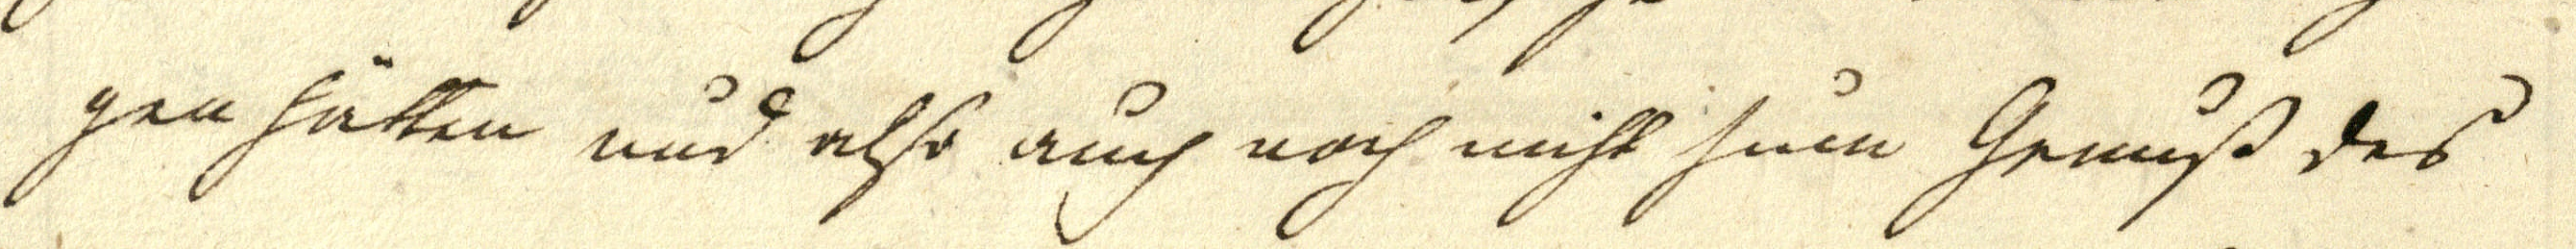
gen hätten und also auch noch nicht zum Genuß des
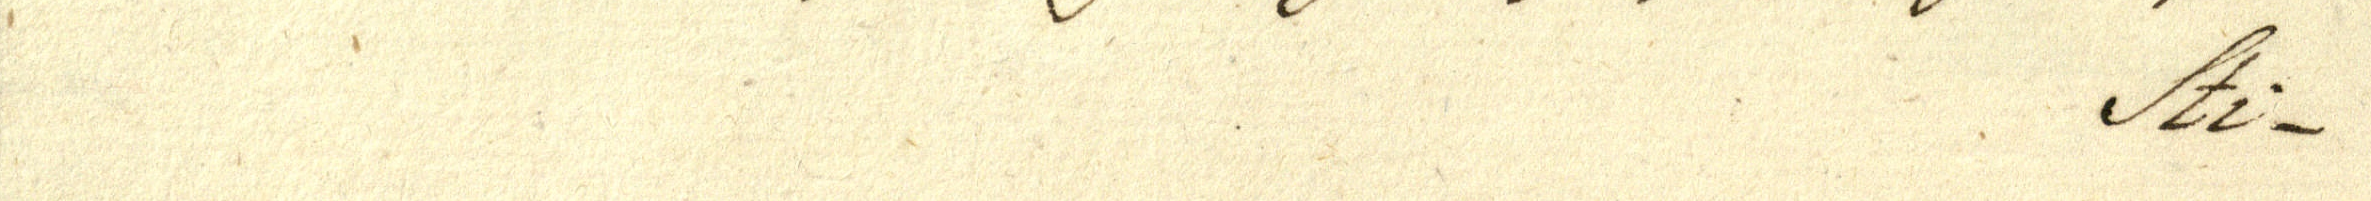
Sti
